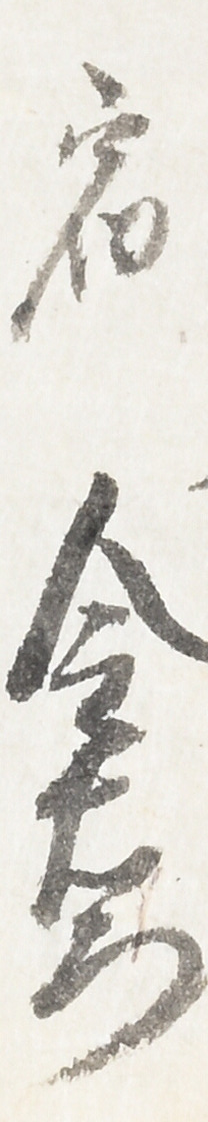宿金右衛門
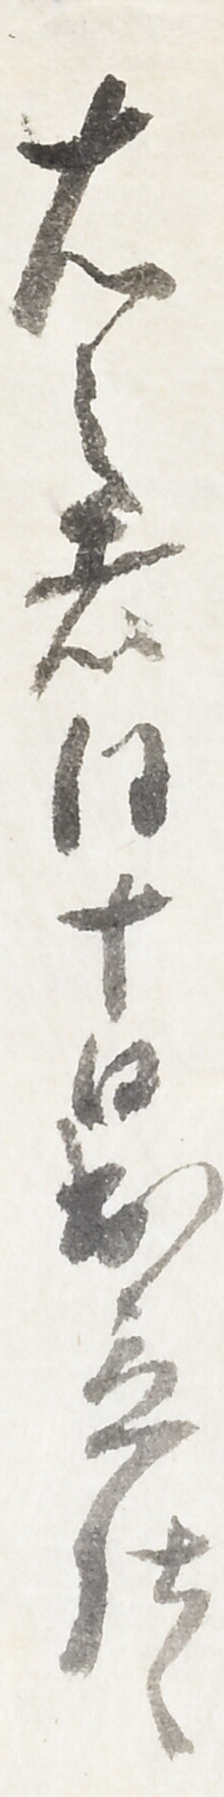右之者同十日出立仕候
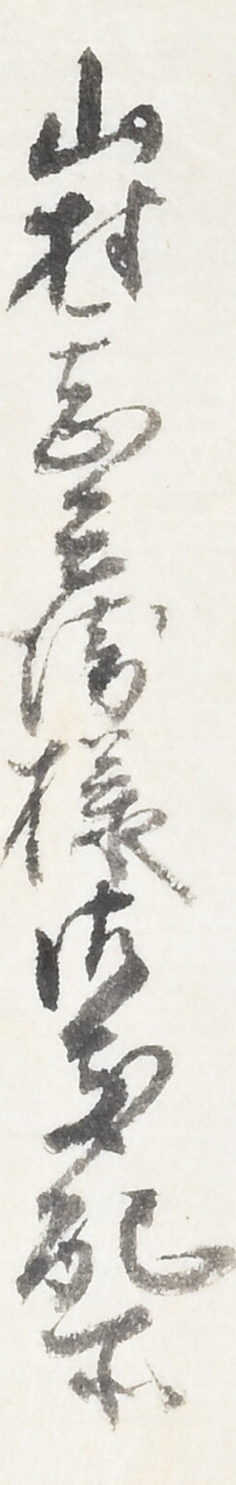山村甚兵衛様御支配所
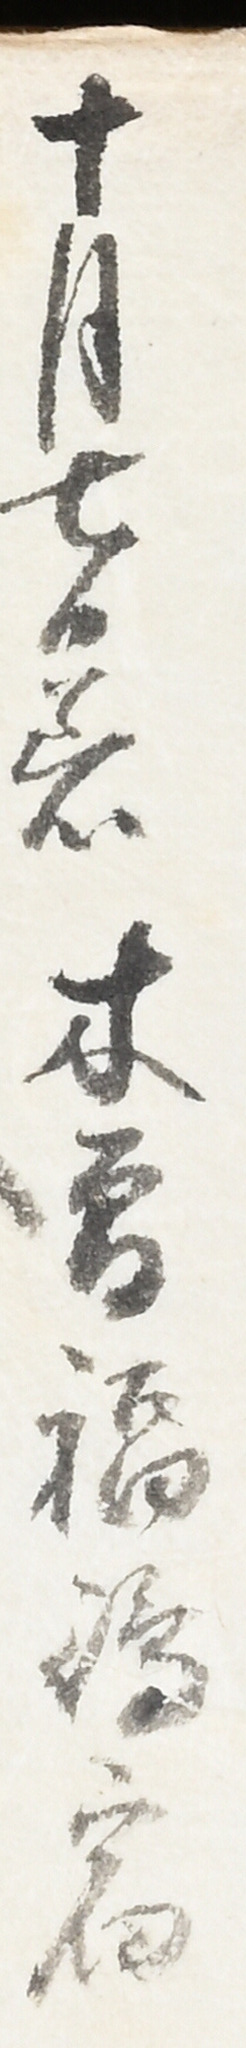十月七日着木曽福嶋宿
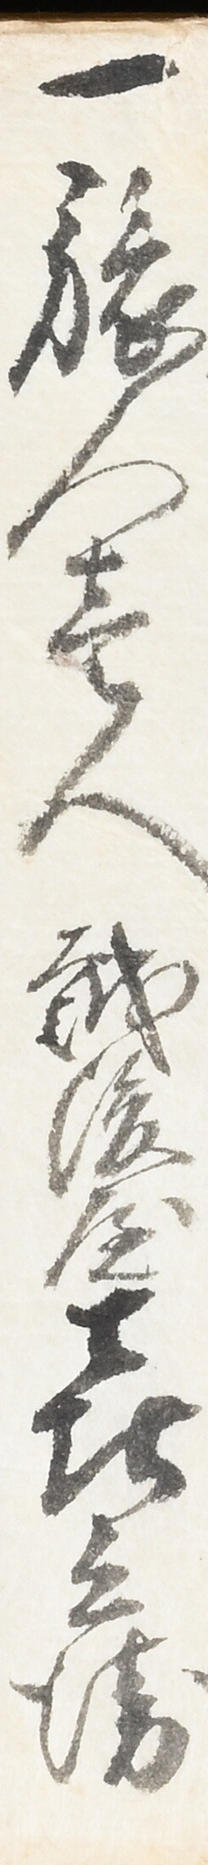一旅人壱人越後屋喜兵衛
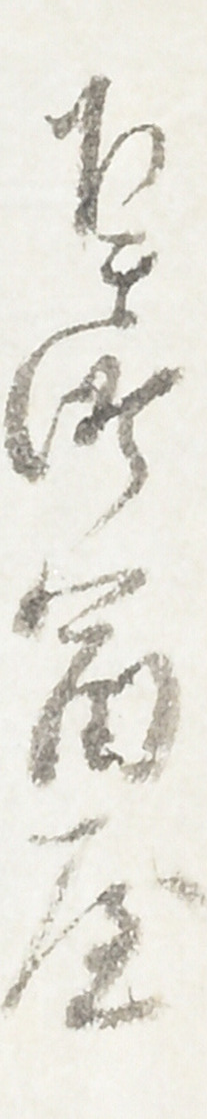下モ町冨屋
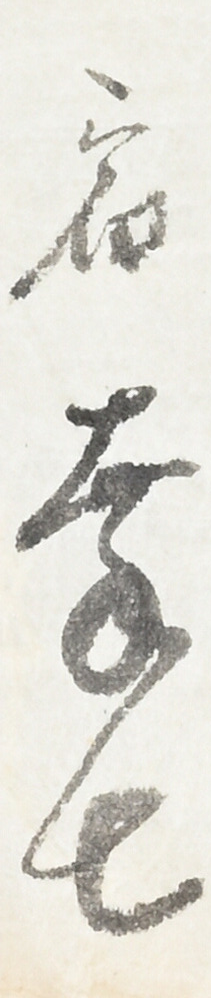宿幸七
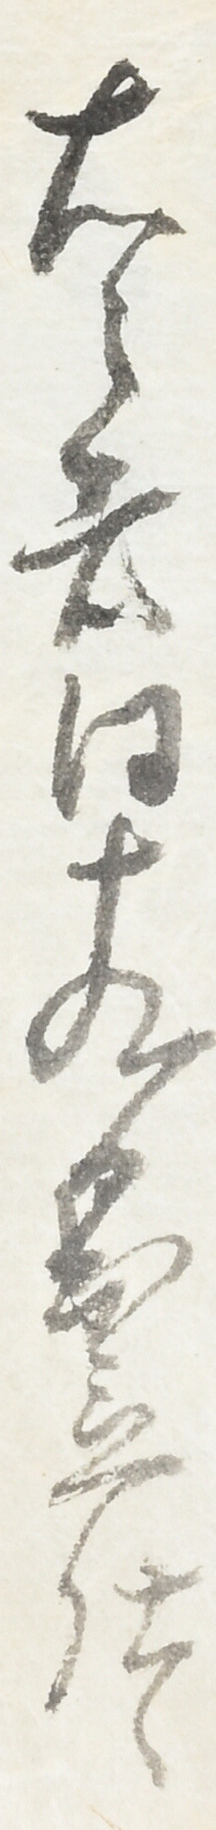右之者同十九日出立仕候

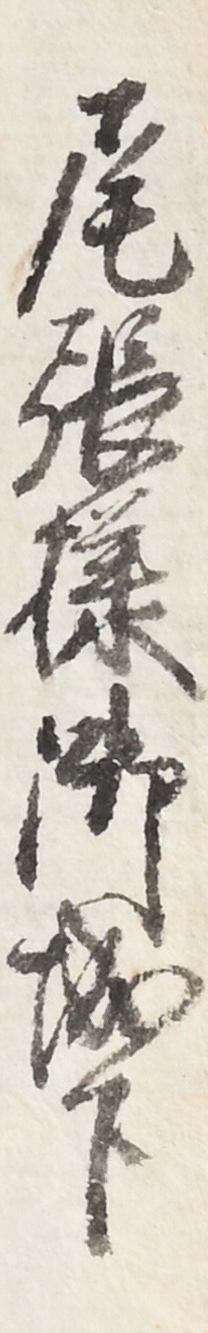尾張様御城下
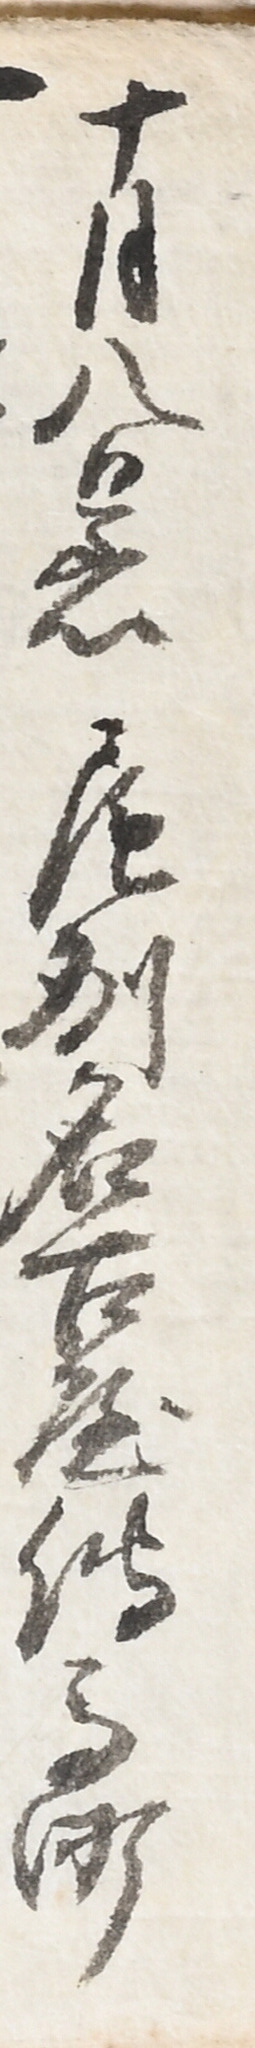十月八日着尾州名古屋伝馬町
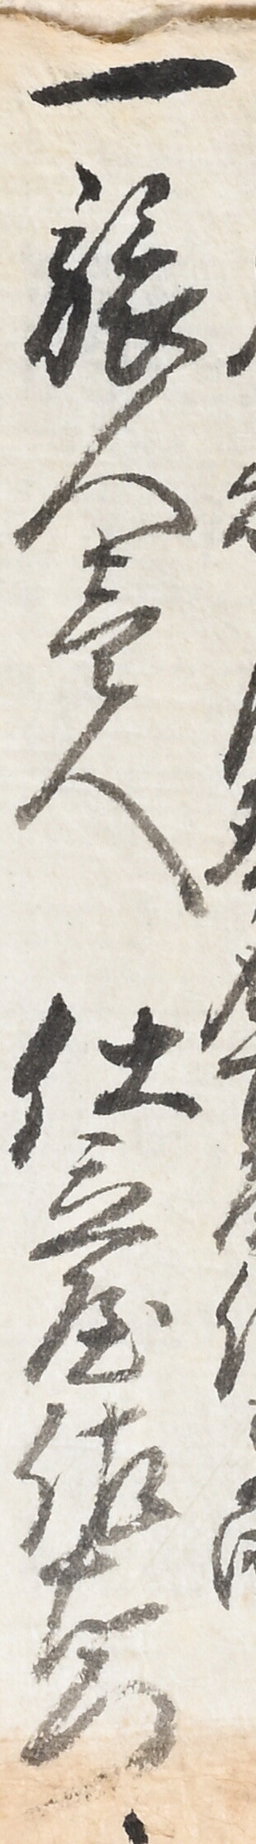一旅人壱人仕立屋佐右衛門・
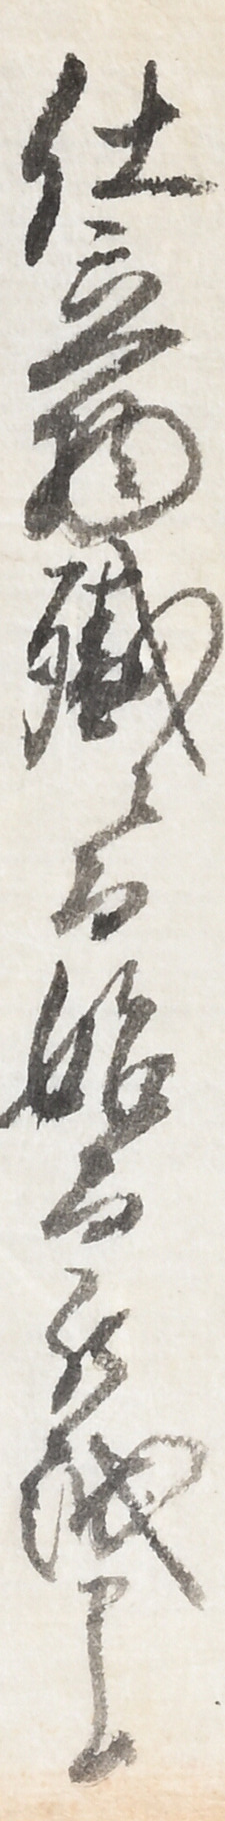仕立物職ニ而始而罷越申候
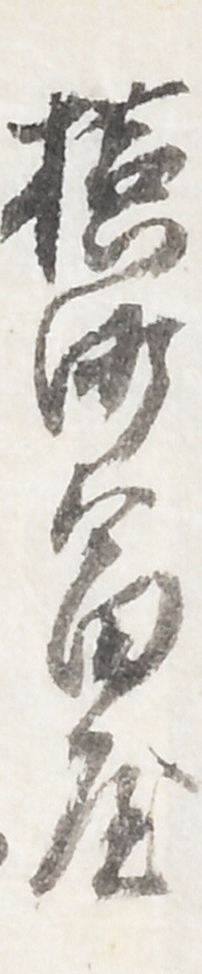横町塩屋
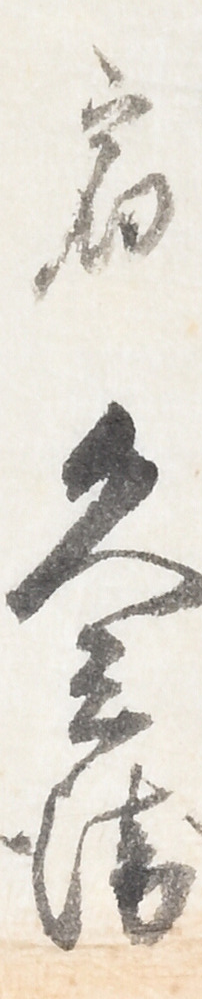宿久兵衛
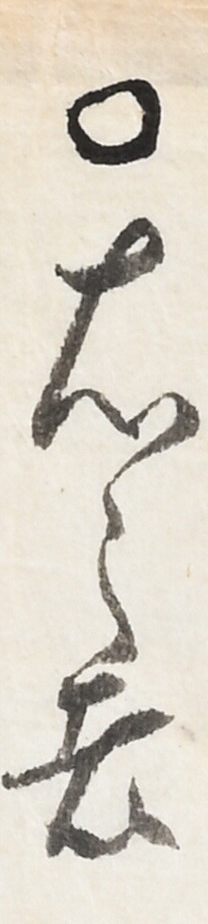〇右之者
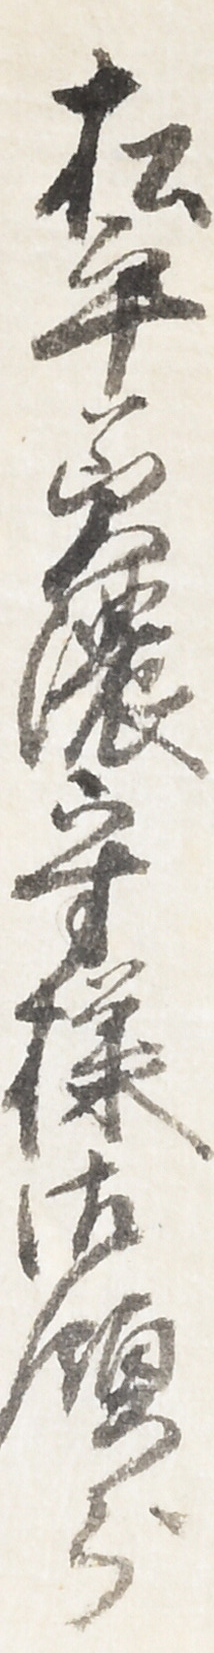松平美濃守様御領分
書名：旅人泊控帳
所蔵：伊那市立高遠町図書館・合同会社AMANE
